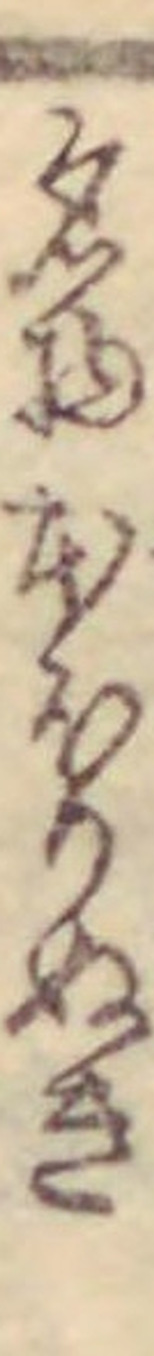名物本ほりぬき
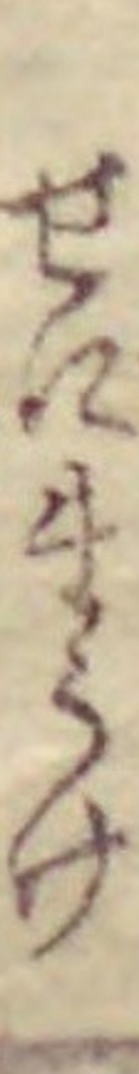ぜにまうけ
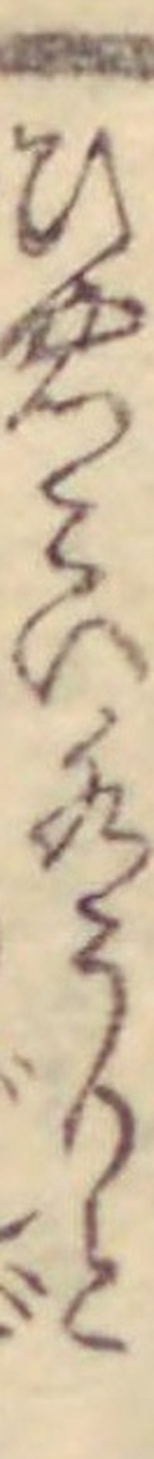ひやつこい水うりと
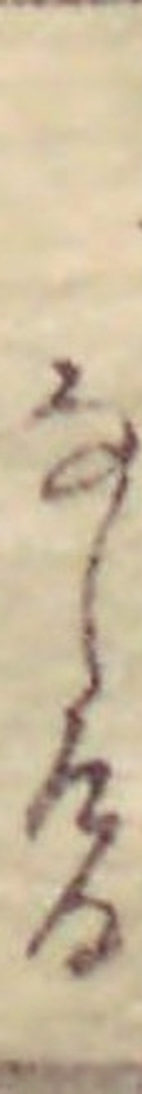なしける
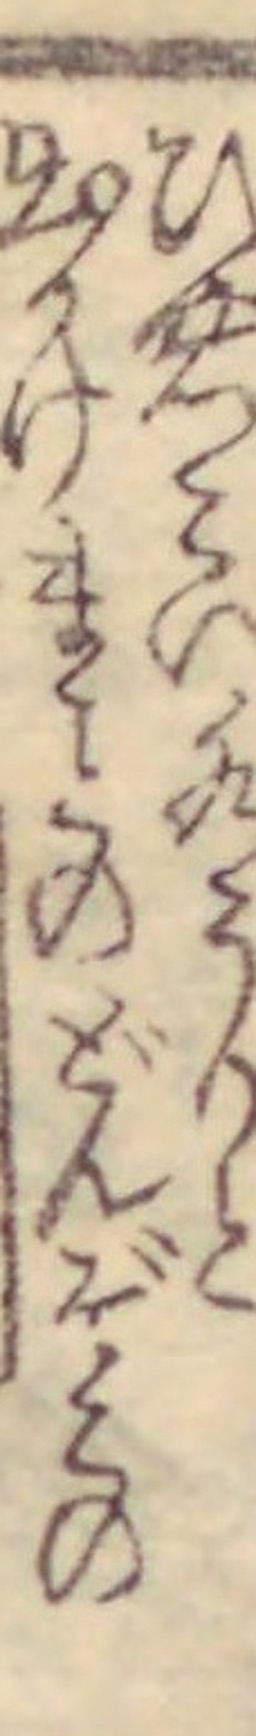出かけまことのどんぞこの
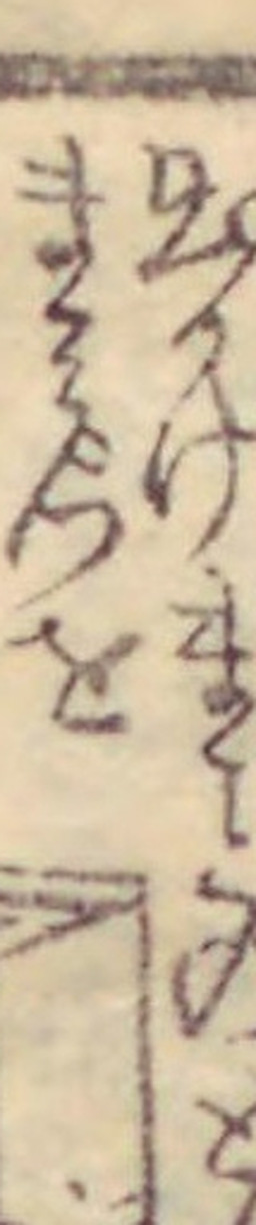まみづを
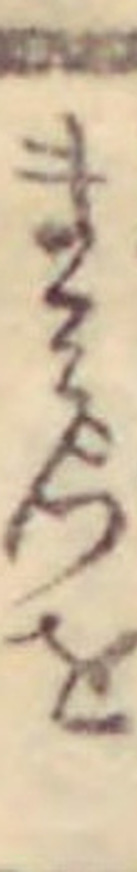まみづを
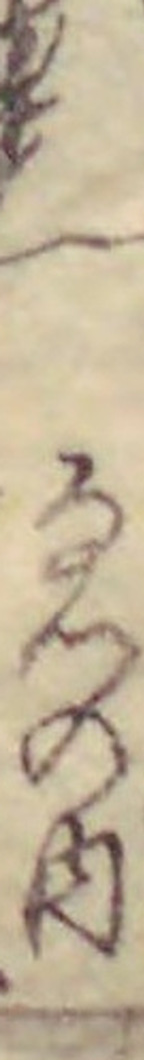なつの内
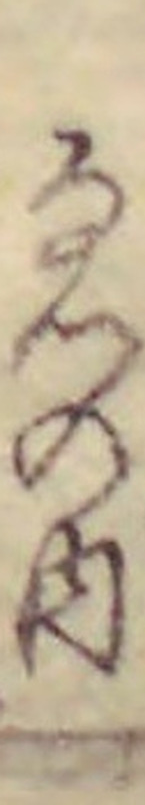なつの内
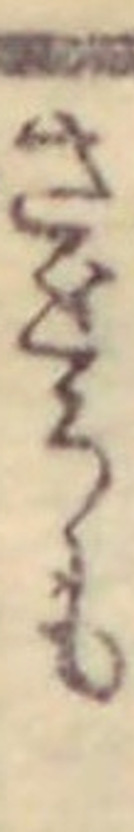さとうも
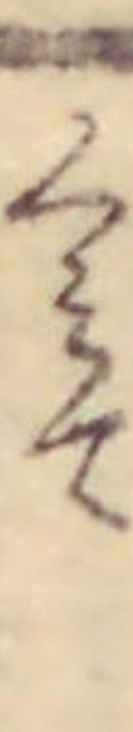くみて
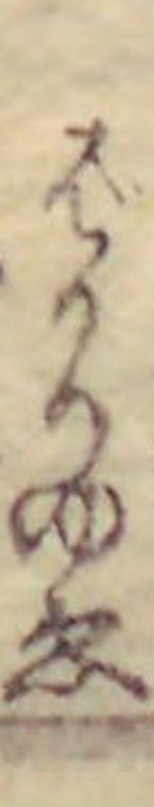ばかりゆゑ
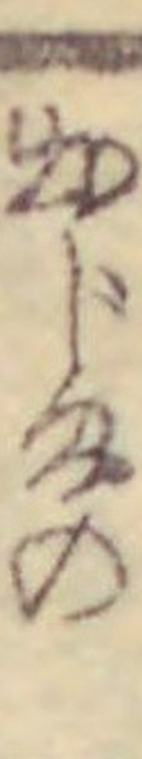出じまの
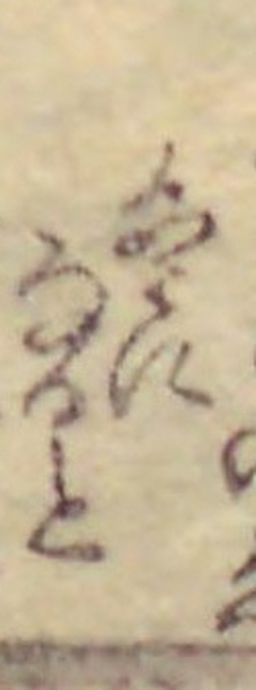なると
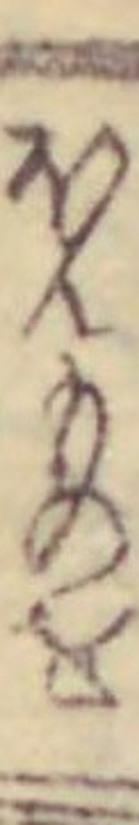ほんものを
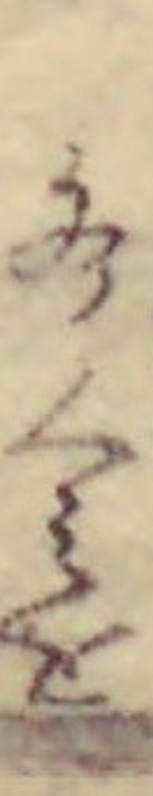水くみを
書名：化物世帯氣質
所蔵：国立国会図書館 National Diet Library, JAPAN
